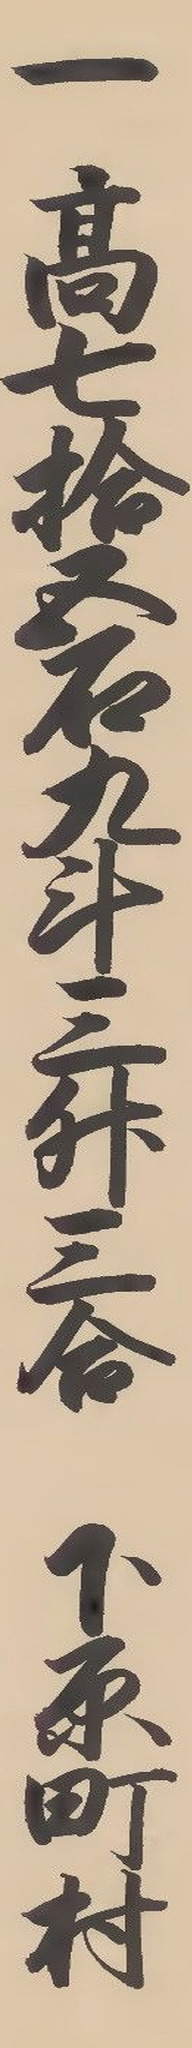一高七拾五石九斗三升三合下原町村
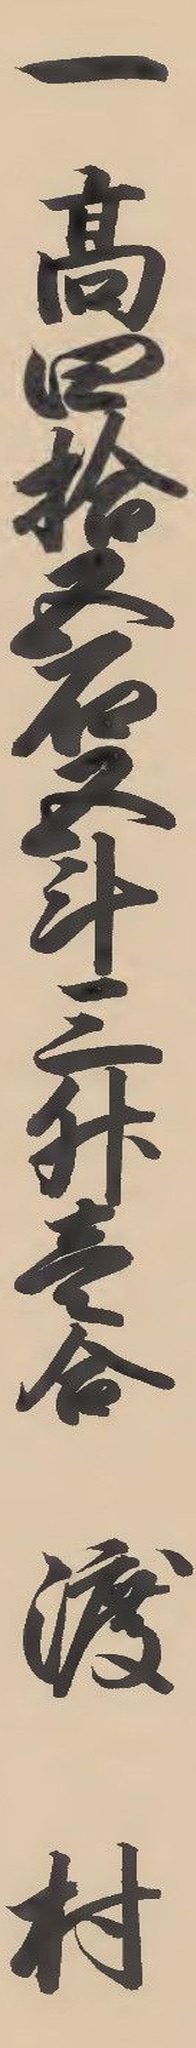一高四拾五石五斗三升壱合渡村
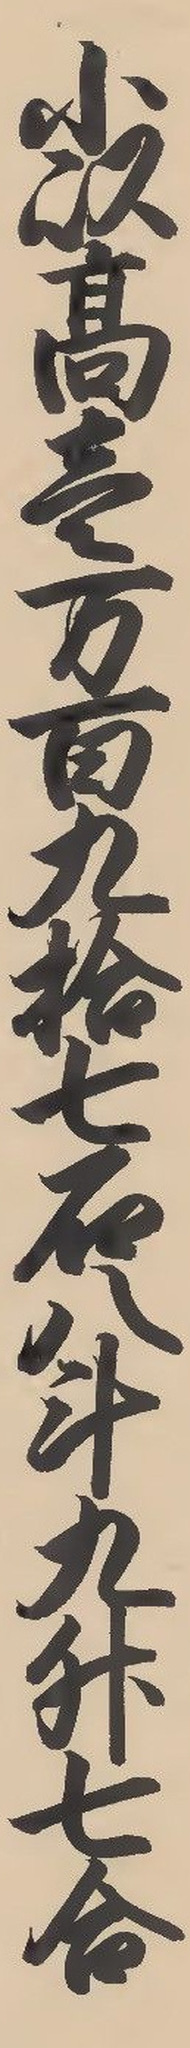小以高壱万百九拾七石八斗九升七合
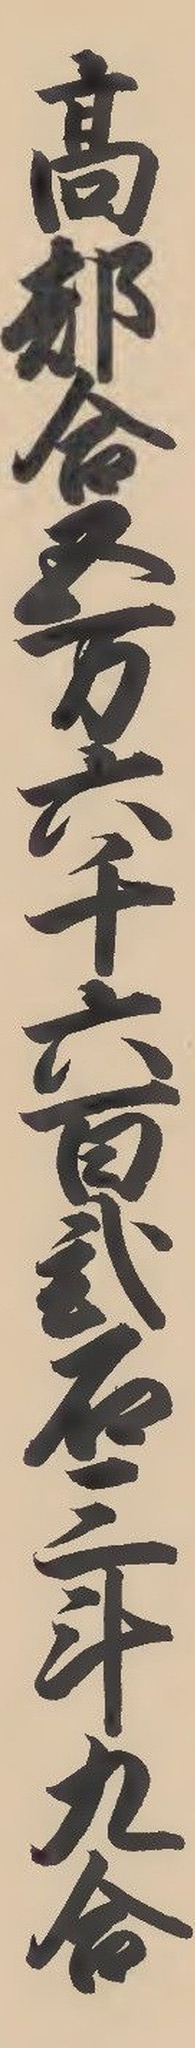高都合五万六千六百弐石三斗九合

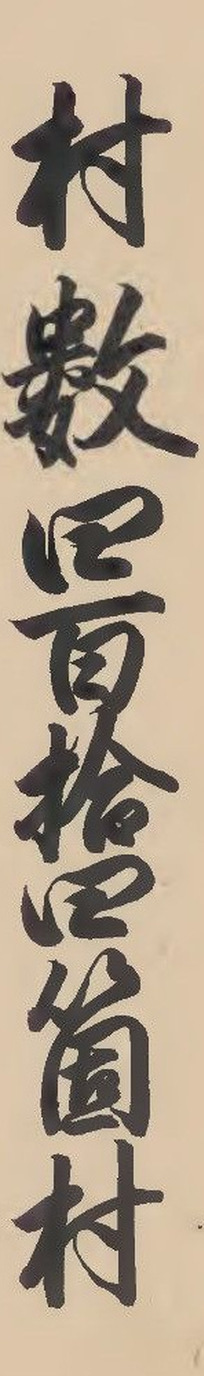村数四百拾四箇村
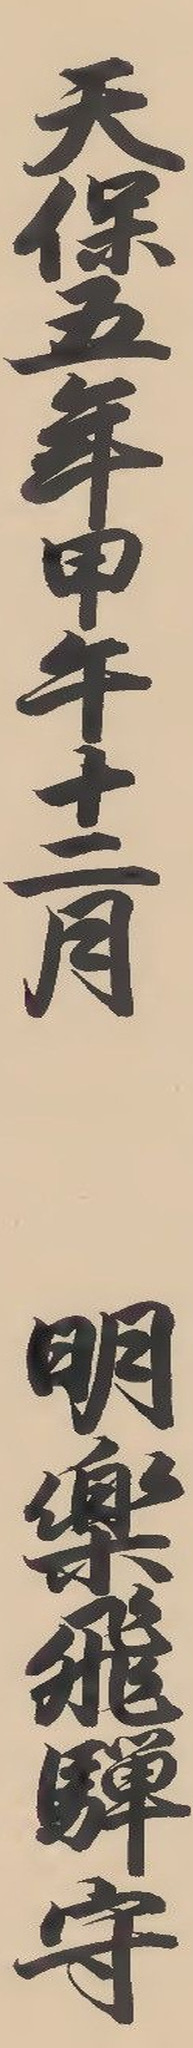天保五年甲午十二月明楽飛騨守
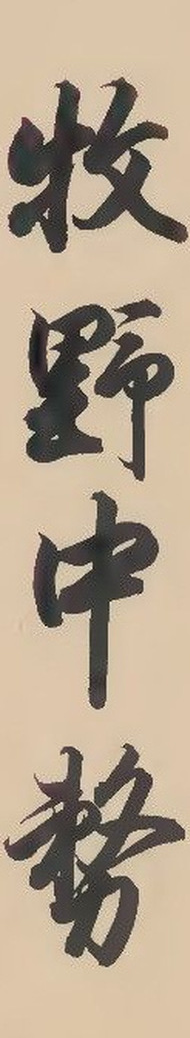牧野中務
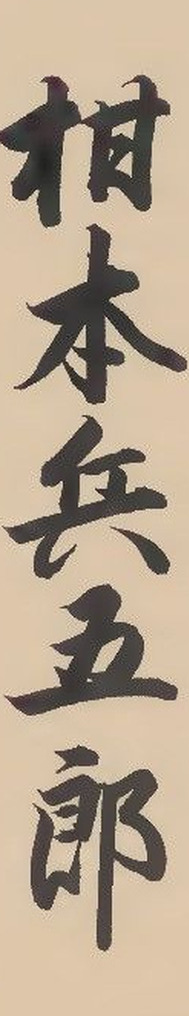柑本兵五郎
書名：飛騨国郷帳
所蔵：国立公文書館 National Archives of Japan
